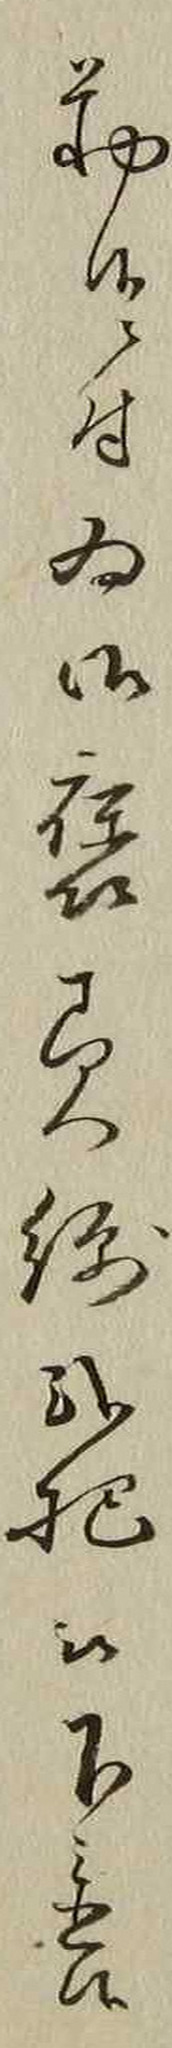勤候ニ付為御褒美綿弐把被下置候
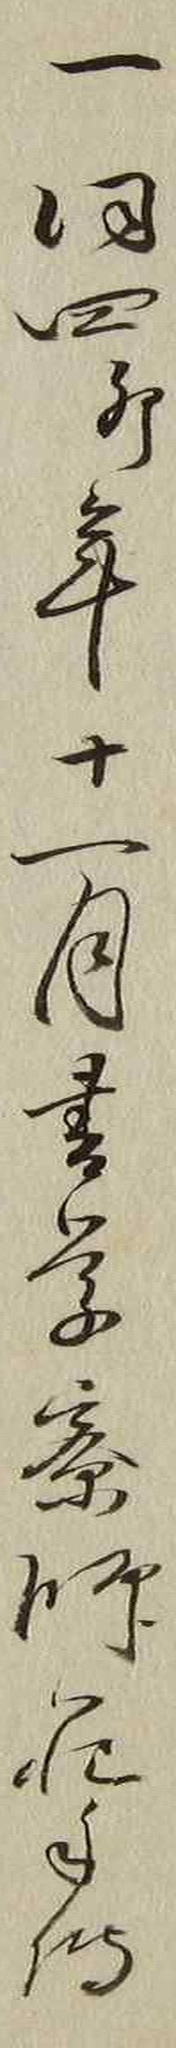一同四卯年十一月書学寮師範手伝
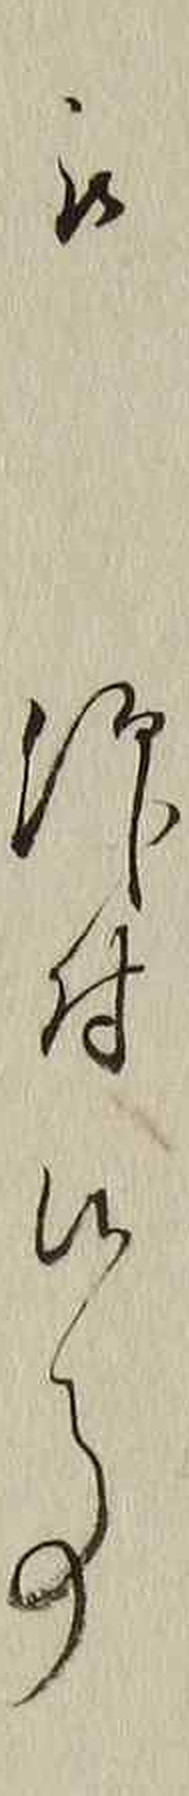被仰付候事
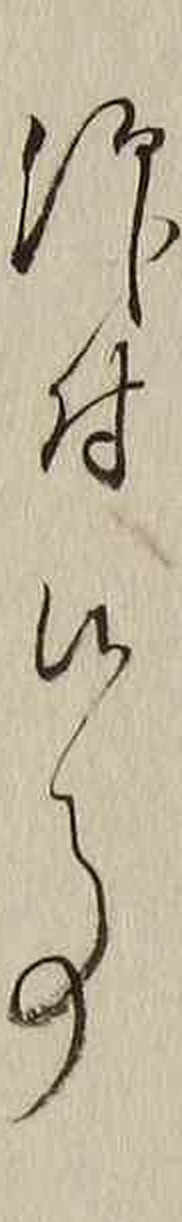仰付候事
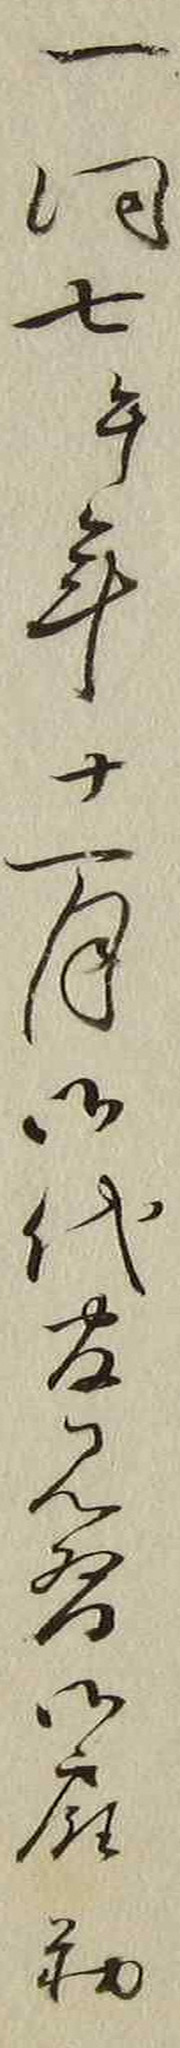一同七午年十一月御代官見習御雇勤
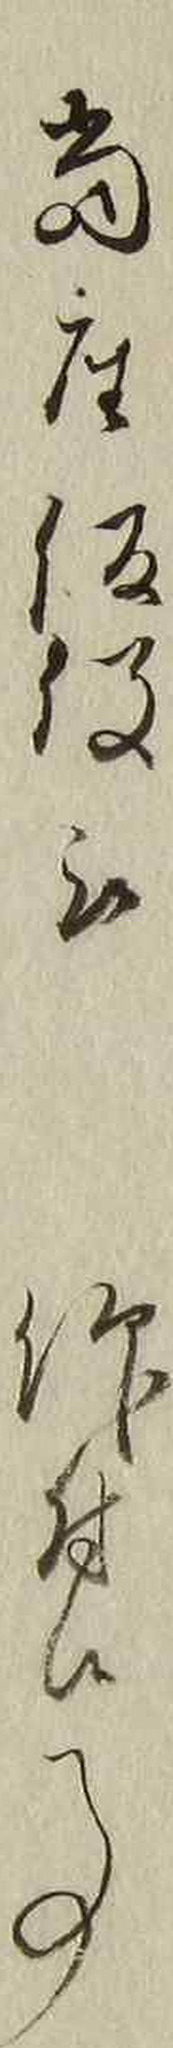当座仮役被仰付候事
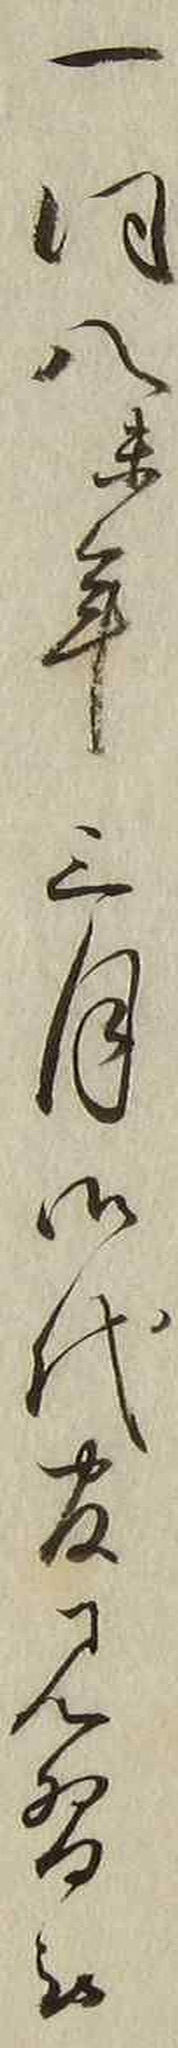一同八未年三月御代官見習被
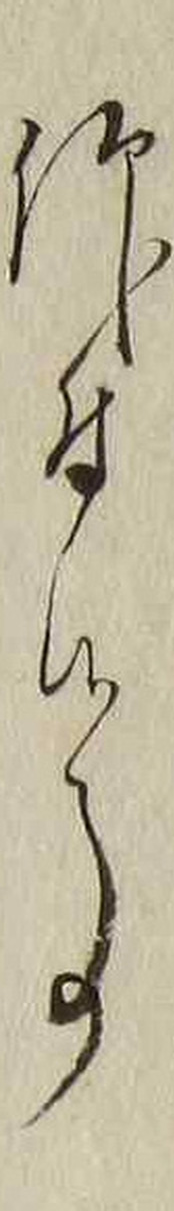仰付候事
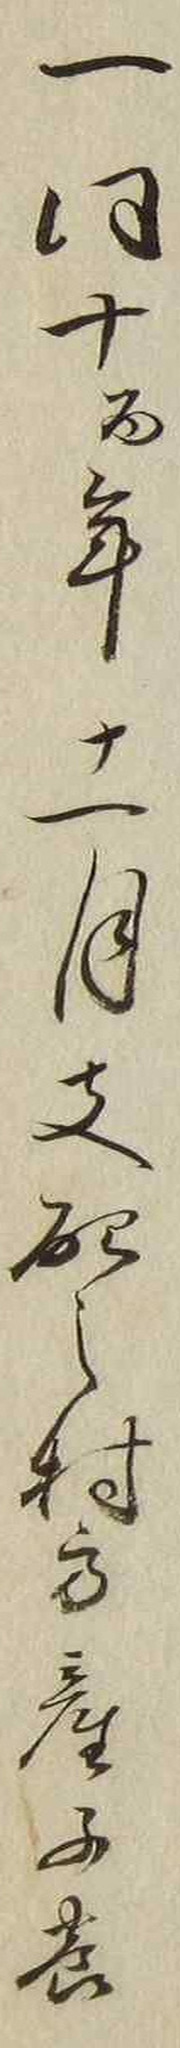一同十酉年十一月支配之村方産子養

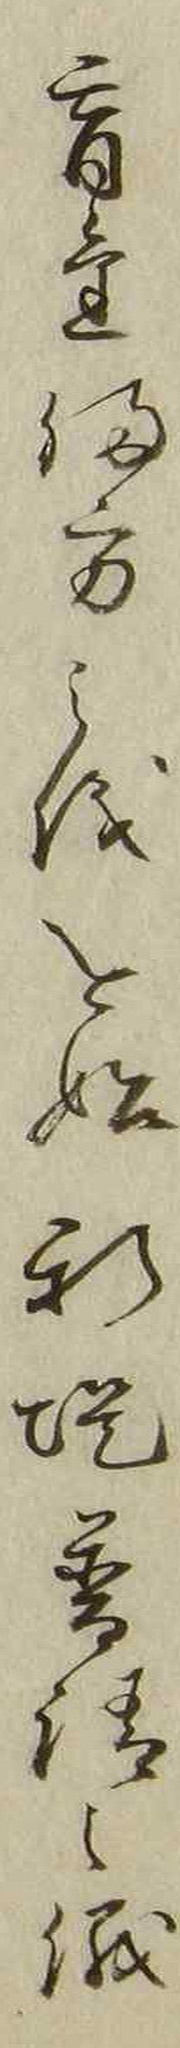育金備方之儀を始新堤普請之儀
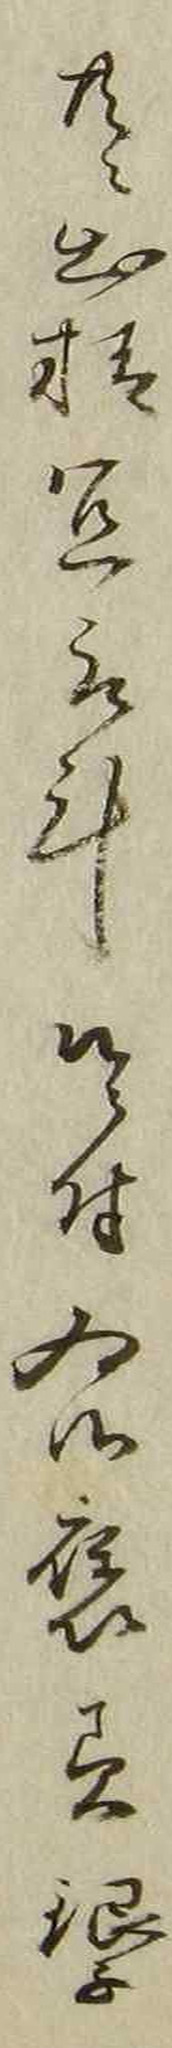共ニ出精宜取計候ニ付為御褒美銀子
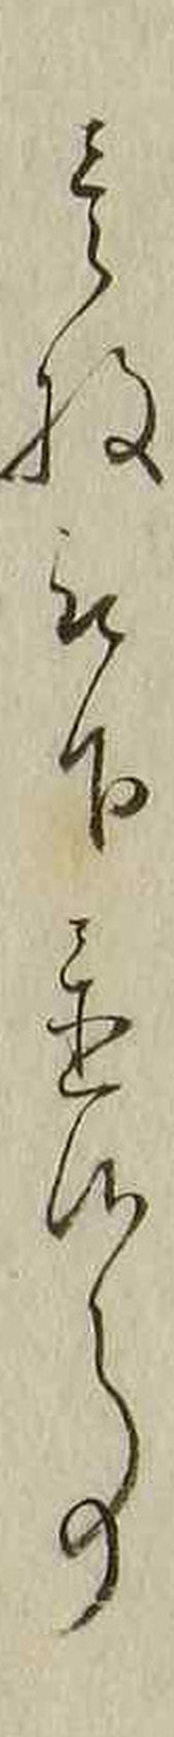壱枚被下置候事
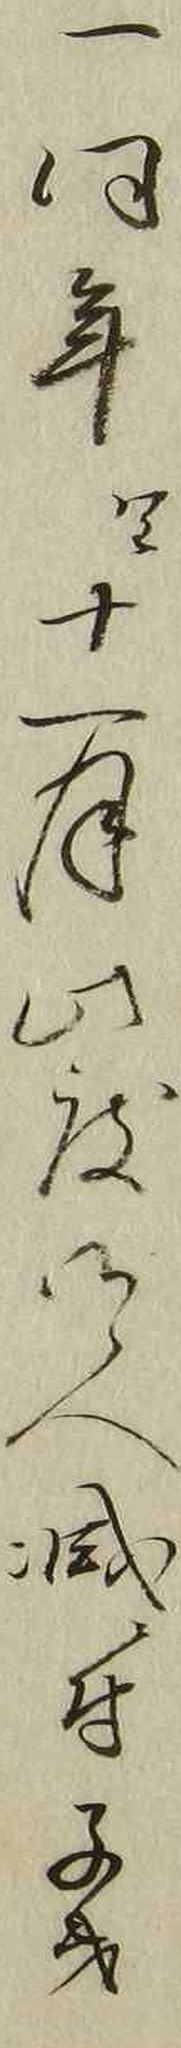一同年閏十一月此度御人減ニ付子弟
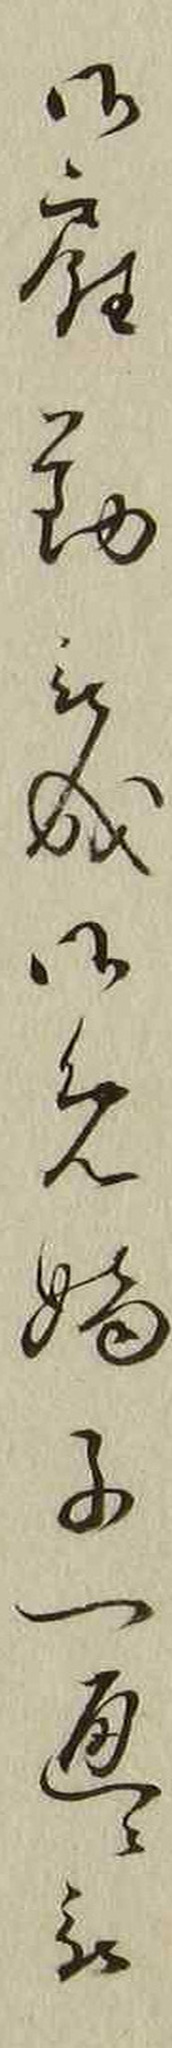御雇勤被成御免嫡子一通ニ被
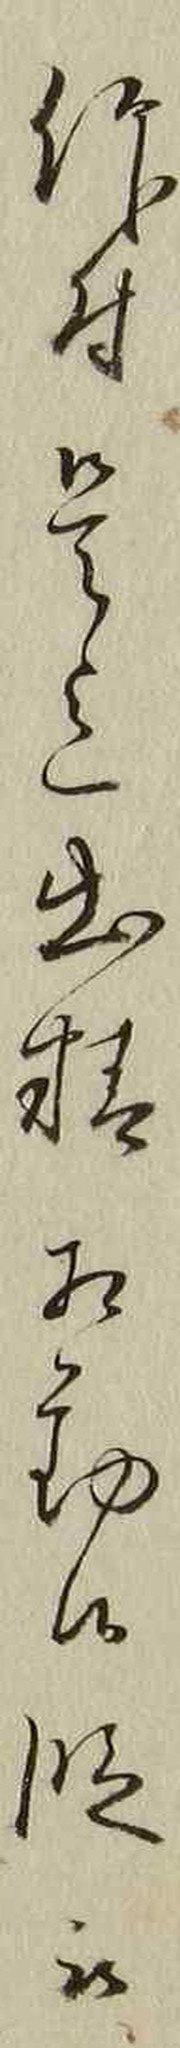仰付是迄出精相勤候段被
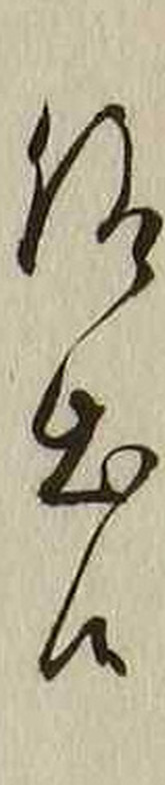仰出候
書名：諸士系譜　巻之4　い之部4
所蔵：会津若松市立会津図書館
